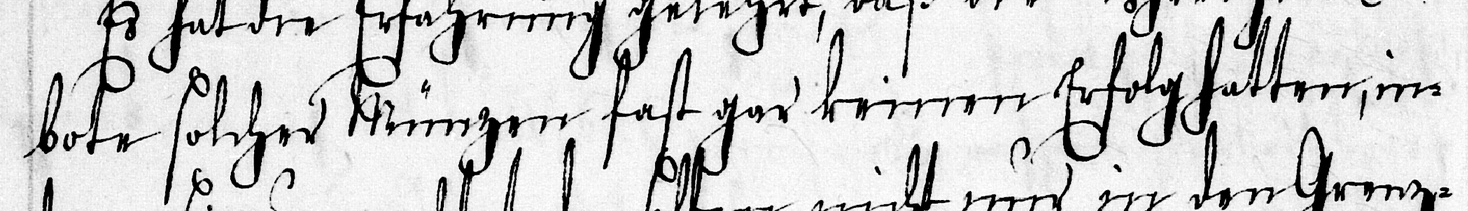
bote solcher Münzen fast gar keinen Erfolg hatten, in¬
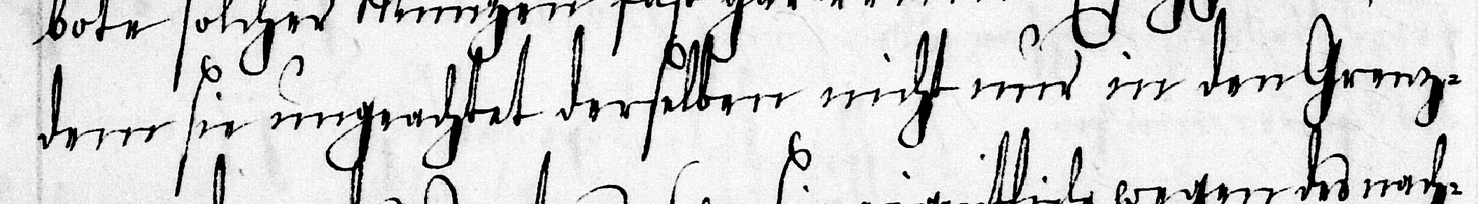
dem sie ungeachtet derselben nicht nur in den Grenz¬
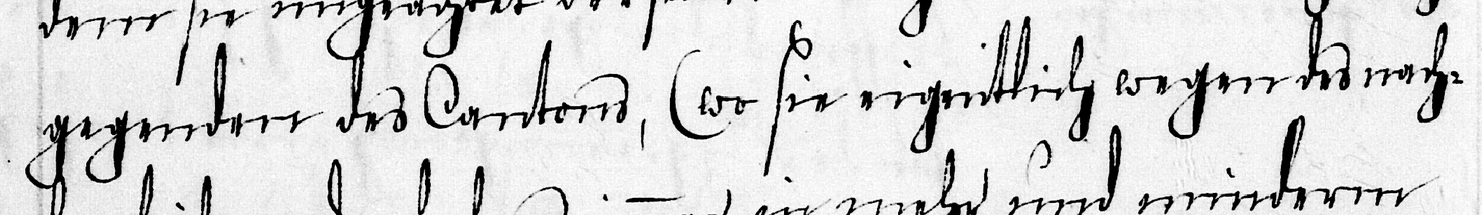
gegenden des Cantons, (wo sie eigentlich wegen des nach¬
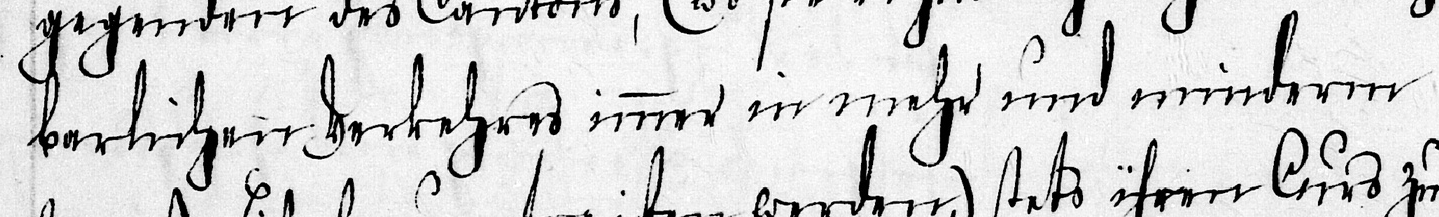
barlichen Verkehres immer in mehr und minderm
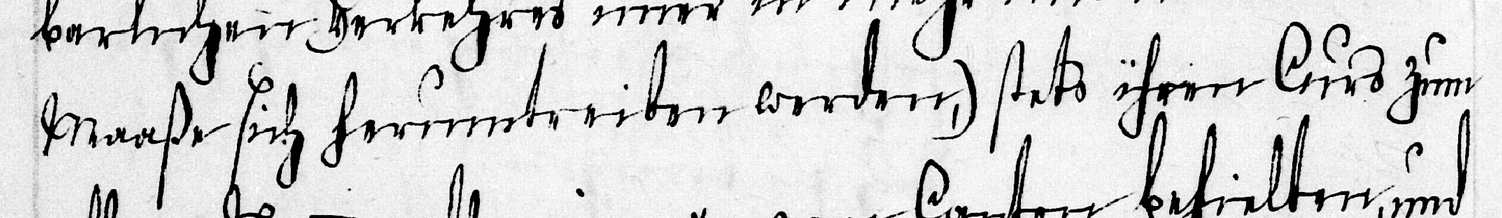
Maaße sich herumtreiben werden,) stets ihren Curs zum
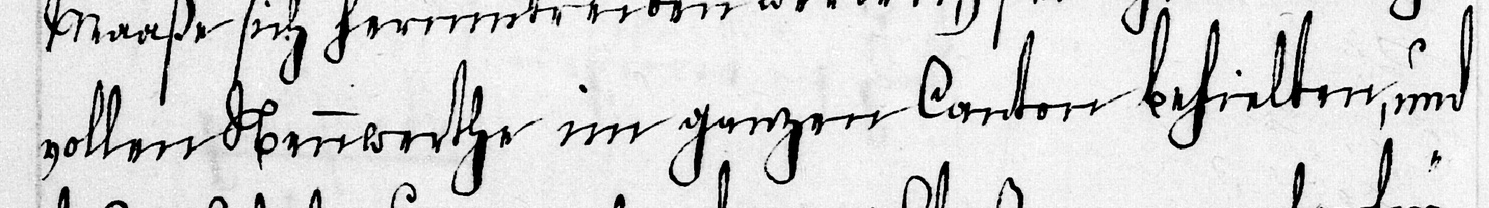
vollen Nennwerthe im ganzen Canton behielten, und
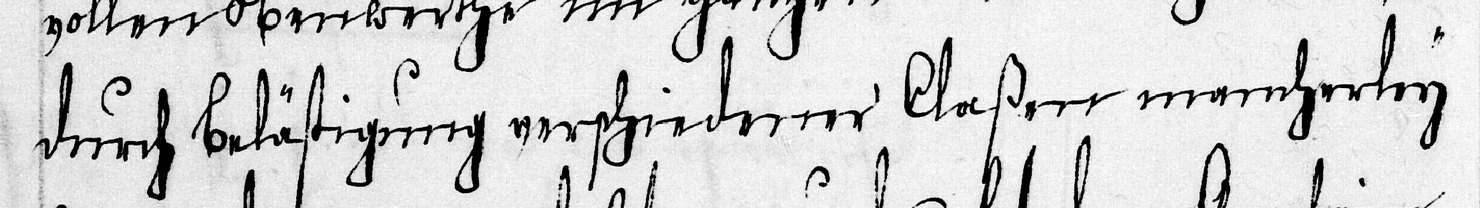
durch Belästigung verschiedener Claßen mancherley
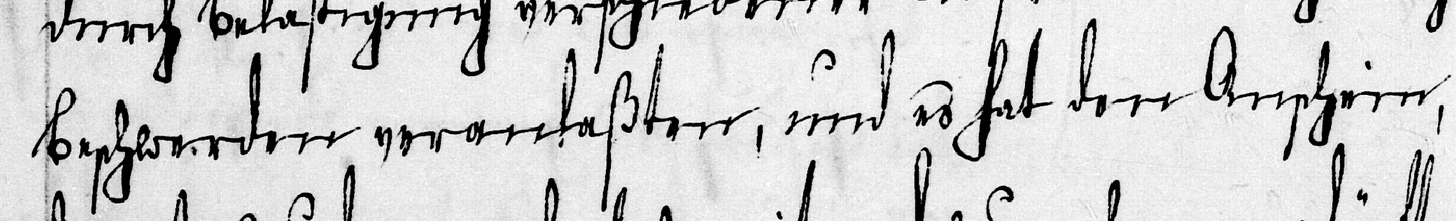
Beschwerden veranlaßten, und es hat den Anschein,
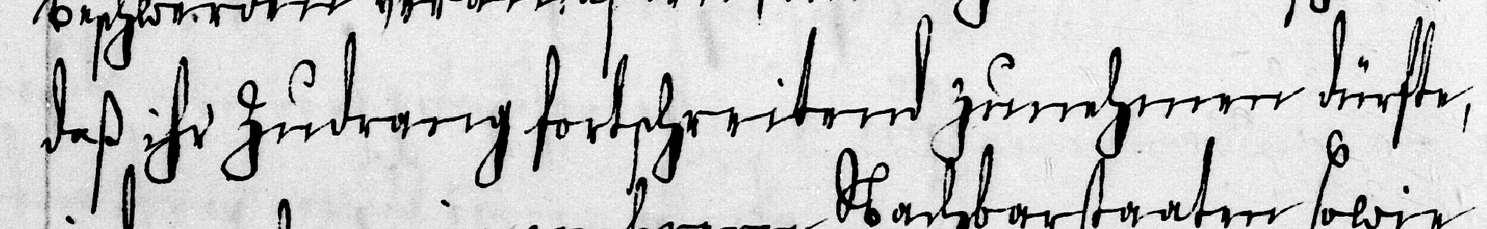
daß ihr Zudrang fortschreitend zunehmen dürfte,
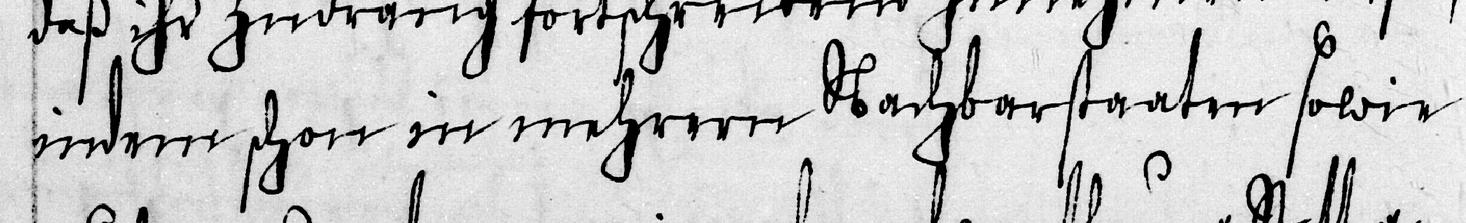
indem schon in mehrern Nachbarstaaten sowie
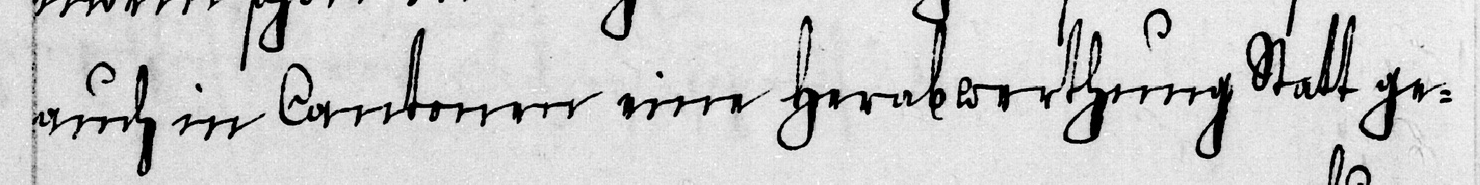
auch in Cantonen eine Herabwerthung Statt ge-
